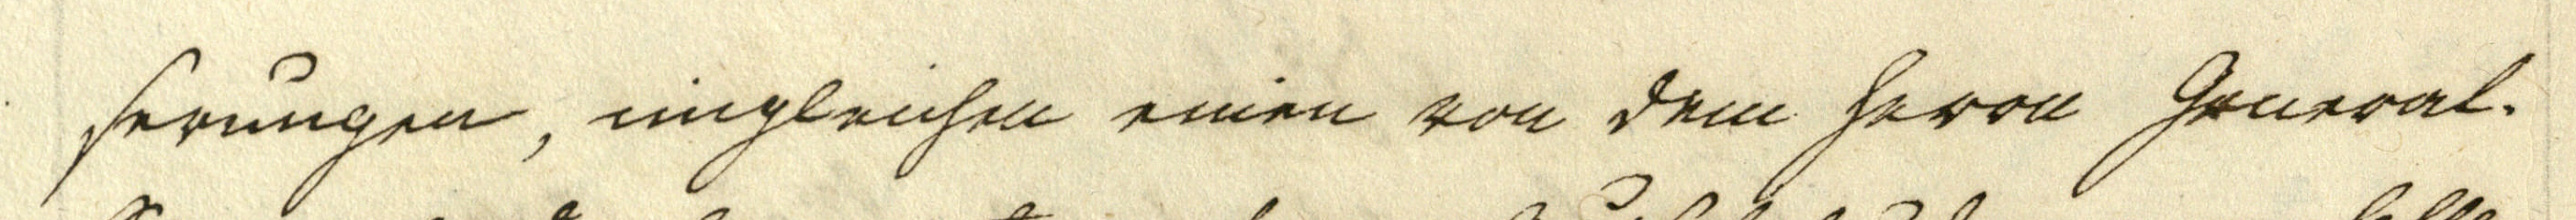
serungen, imgleichen einen von dem Herrn General-
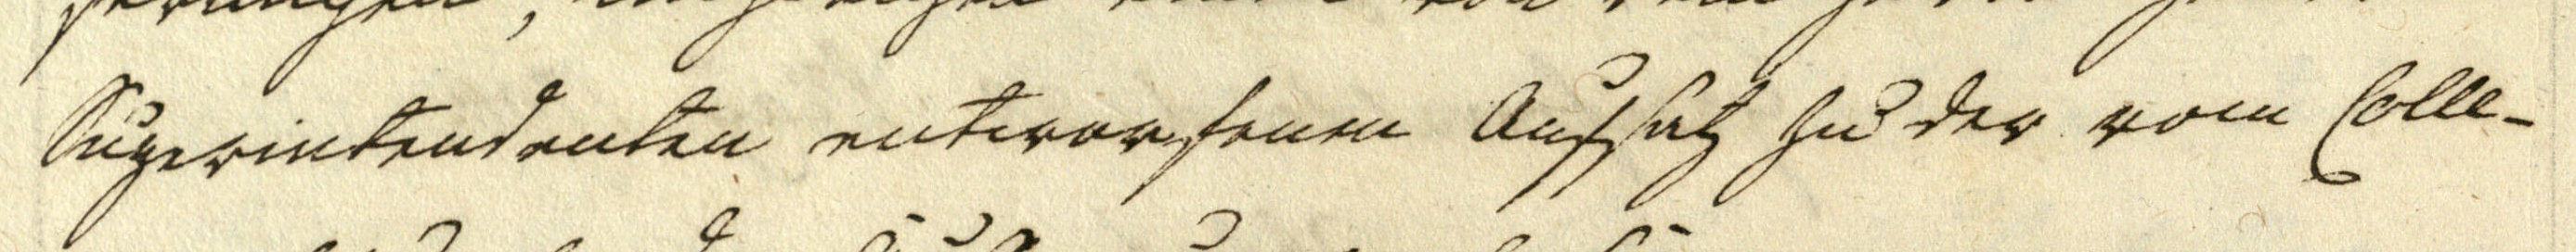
Superintendenten entworfenen Aufsatz zu der vom Colle-
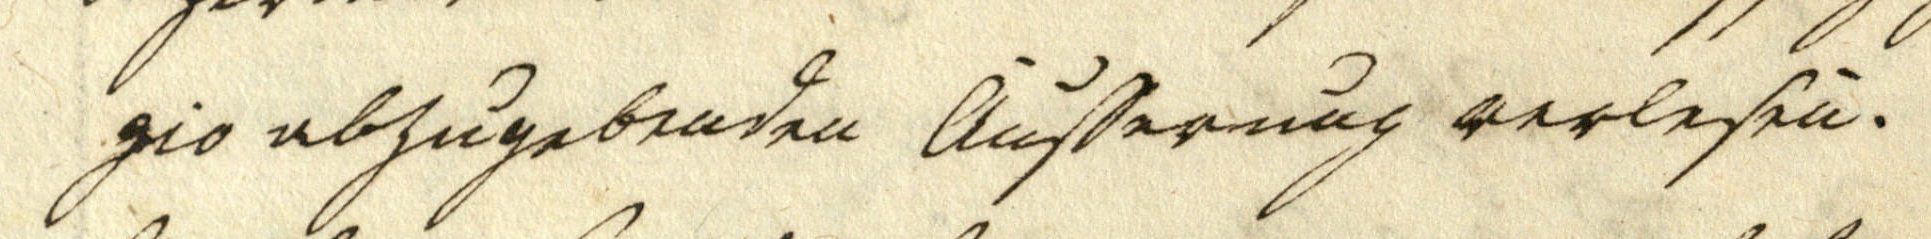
gio abzugebenden Äusserung verlesen.
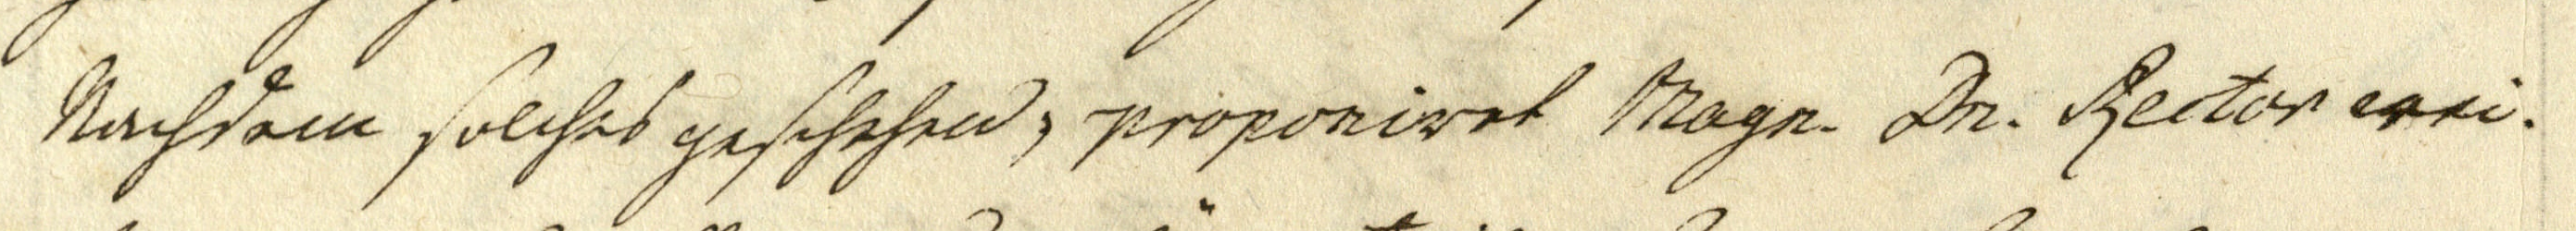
Nachdem solches geschehen, proponiret Magn. Dn. Rector wei-
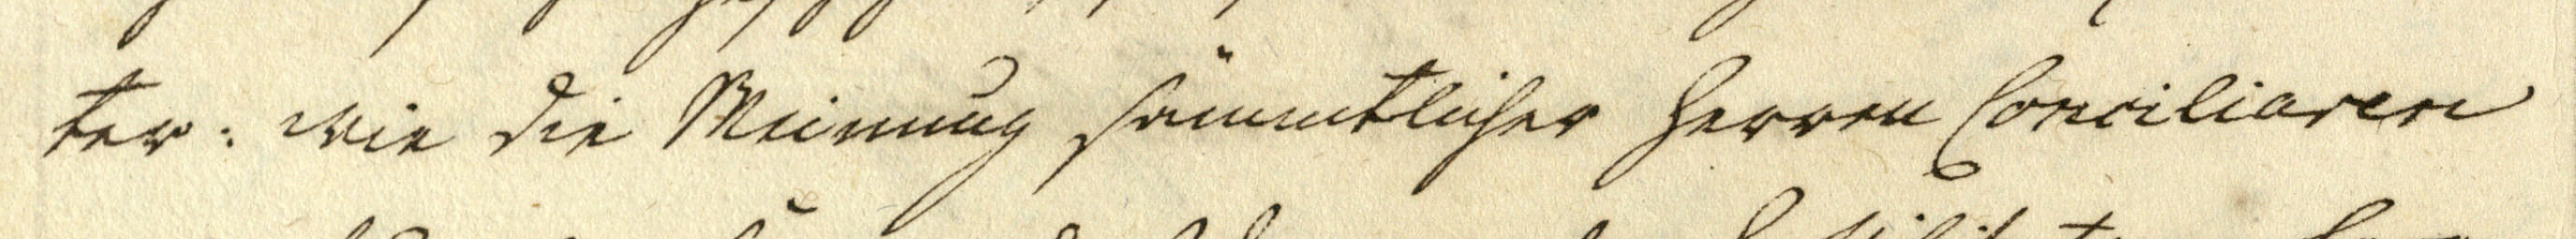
ter: wie die Meinung sämtlicher Herren Conciliaren
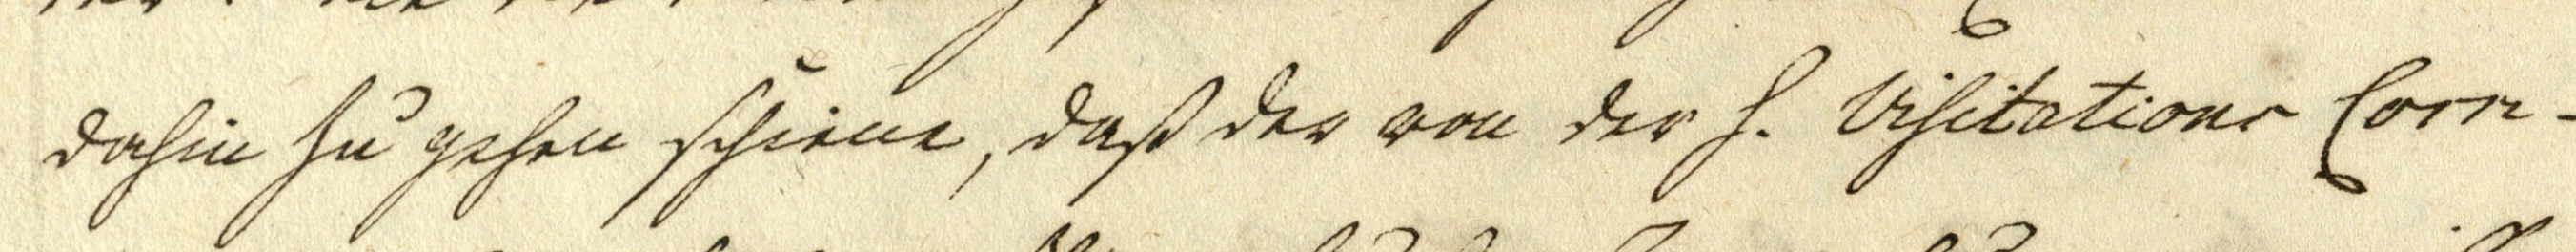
dahin zu gehen scheine, daß der von der h. Visitations Com-
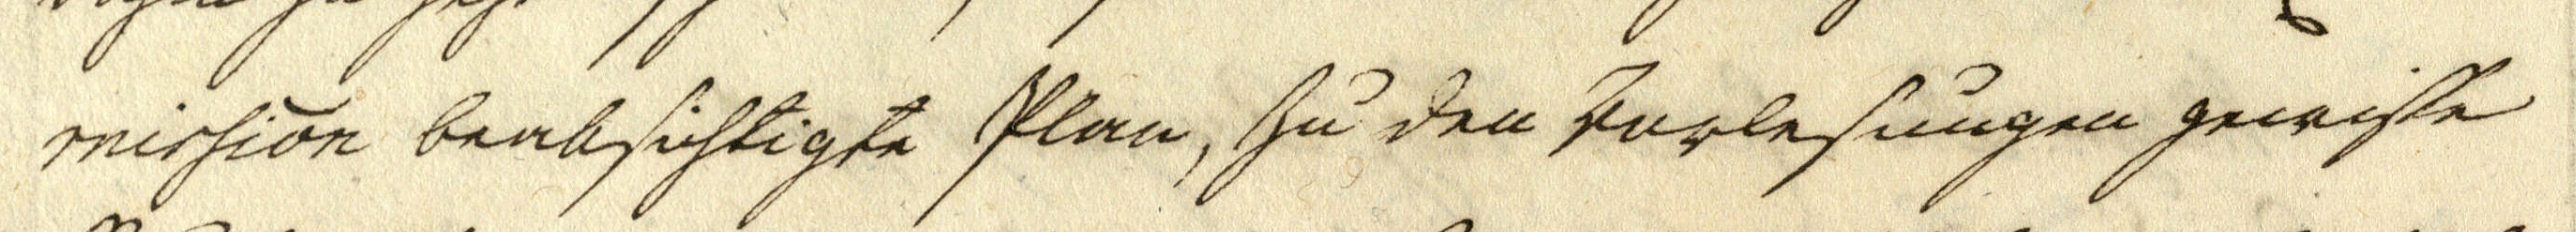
mission beabsichtigte Plan, zu den Vorlesungen gewisse
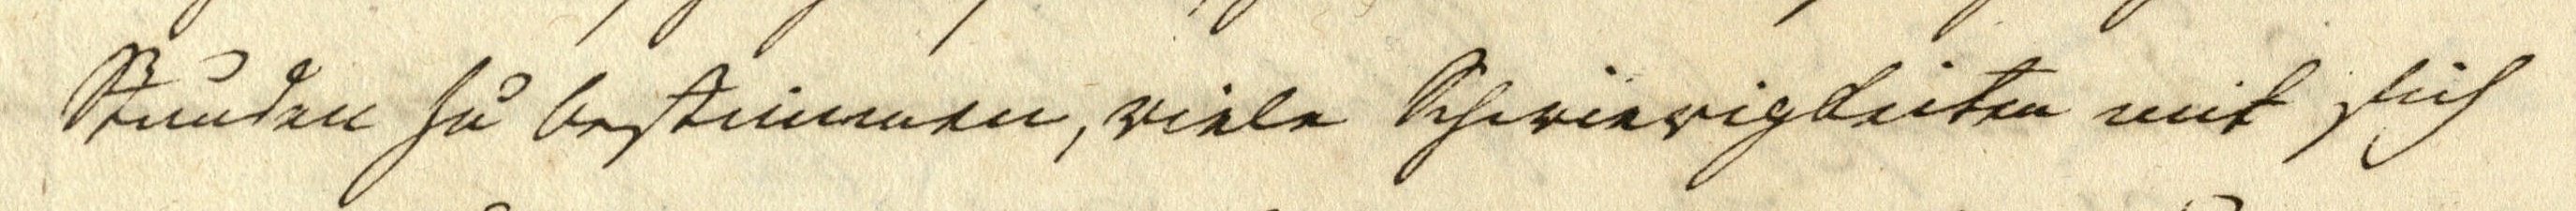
Stunden zu bestimmen, viele Schwierigkeiten mit sich
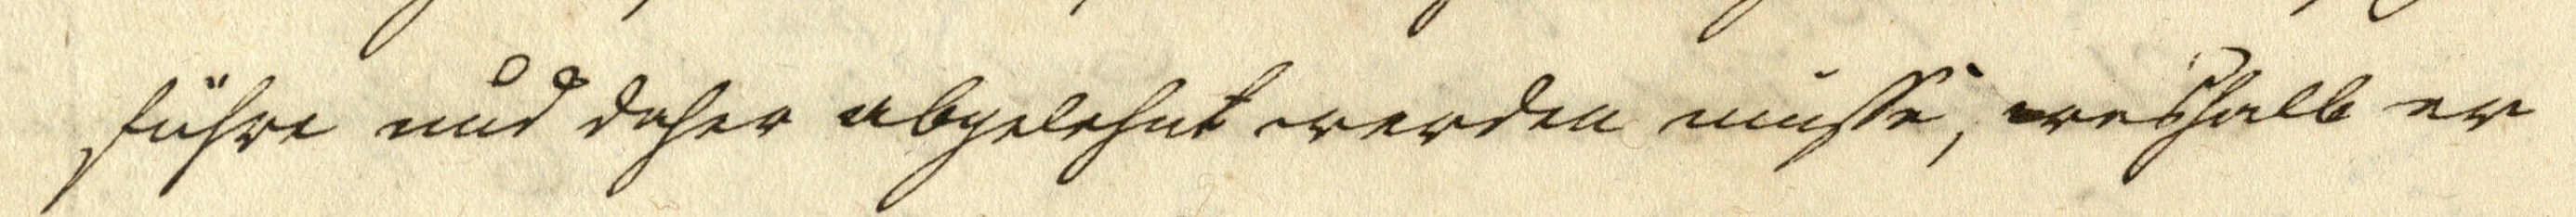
führe und daher abgelehnt werden müsse, weshalb er
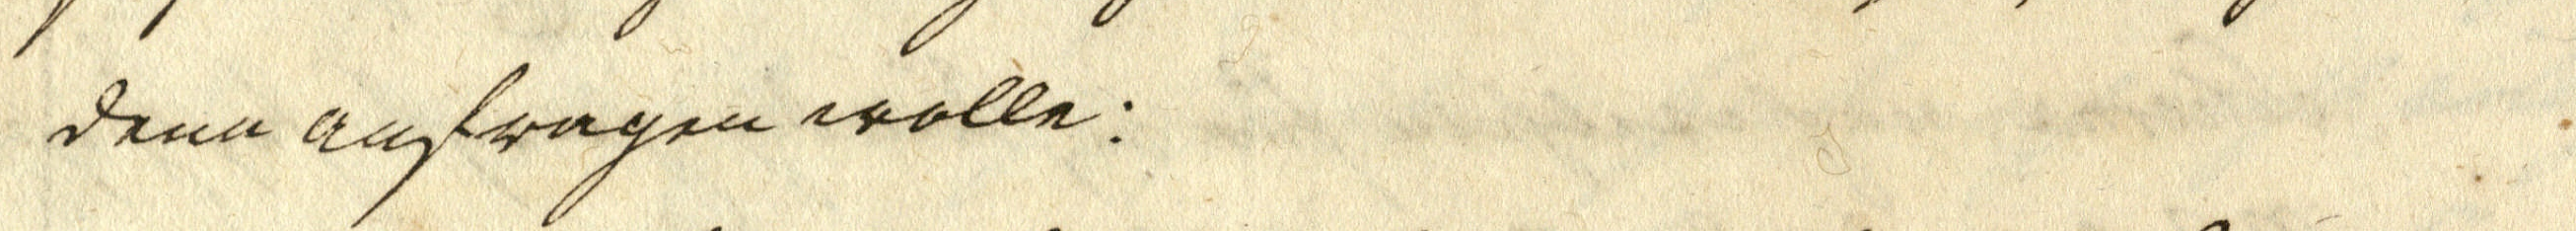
denn anfragen wolle:
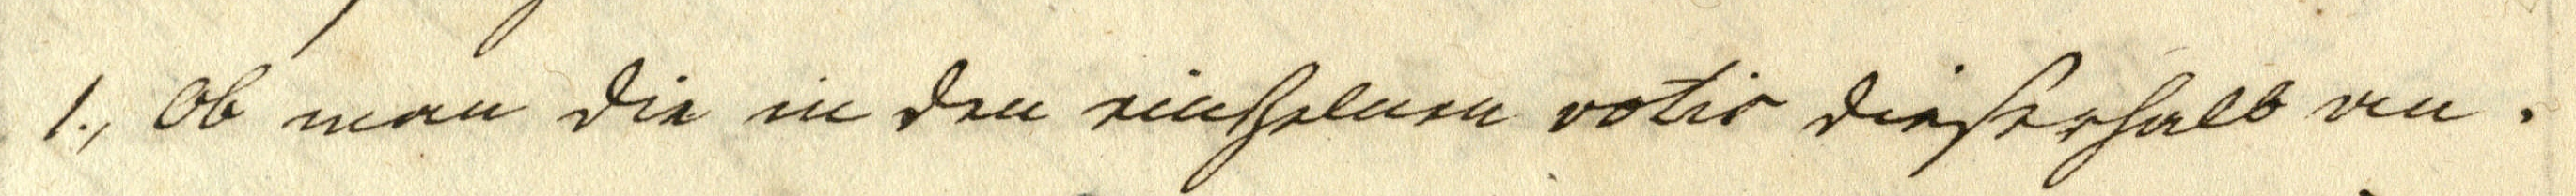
1.) Ob man die in den einzelnen votis dieserhalb an-
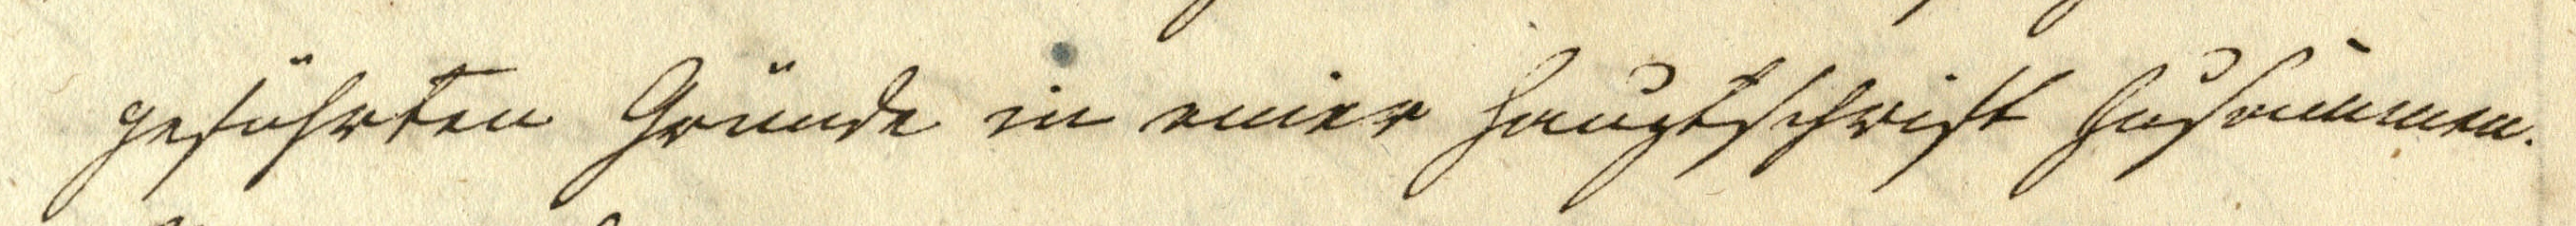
geführten Gründe in einer Hauptschrift zusammen
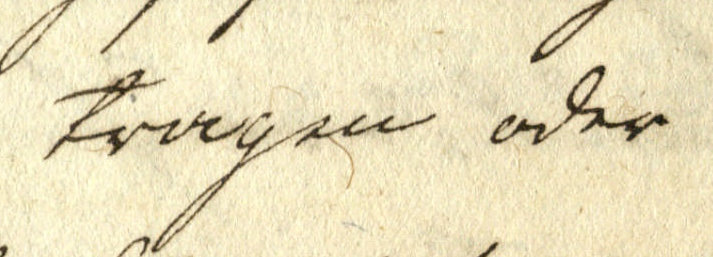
tragen oder
